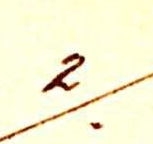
2
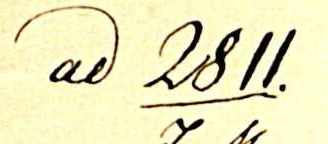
ad 2811.
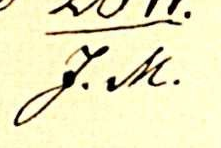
J.M.
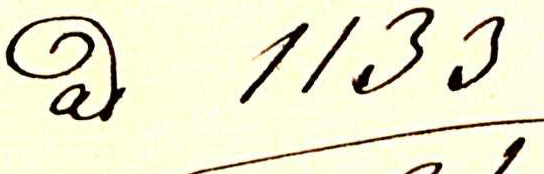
a 1133
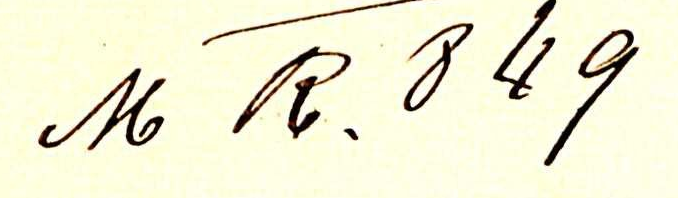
M R. 849
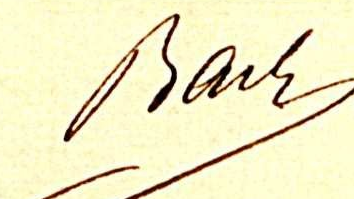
Bach
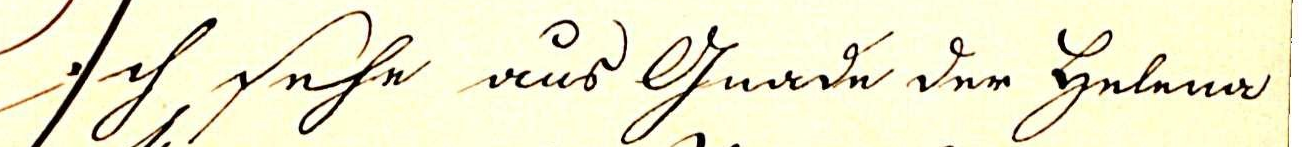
Ich sehe aus Gnade der Helena
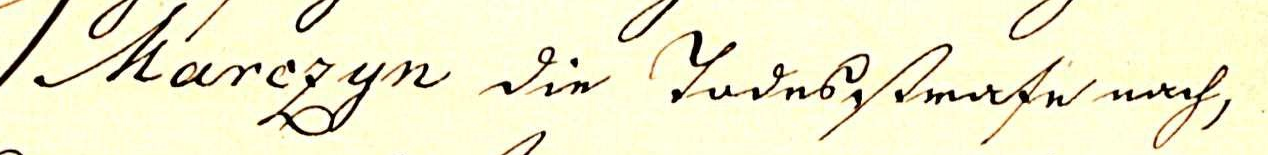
Marczyn die Todesstrafe nach,
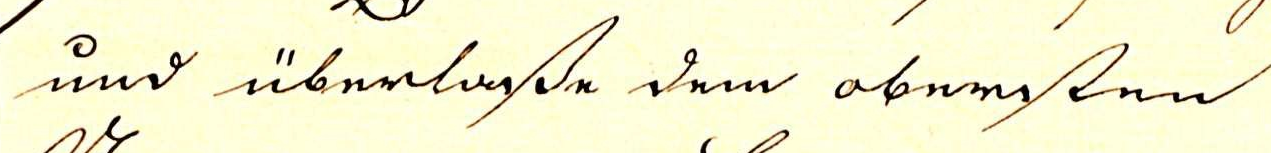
und überlaße dem obersten
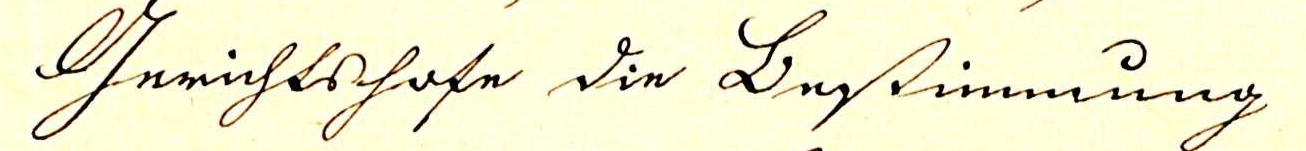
Gerichtshofe die Bestimmung
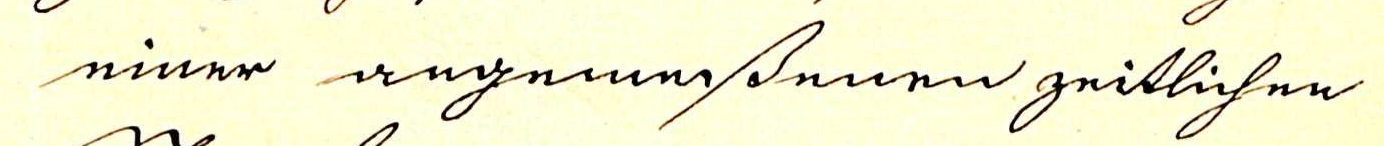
einer angemeßenen zeitlichen
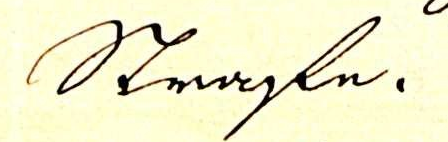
Strafe.
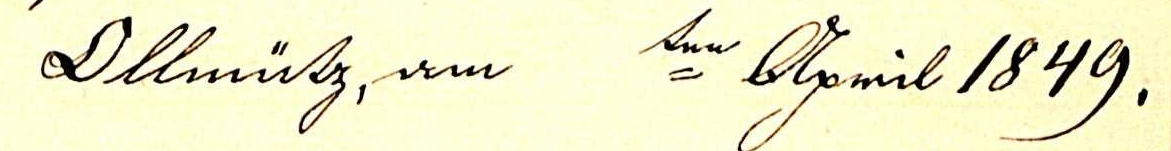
Ollmütz, am April 1849
